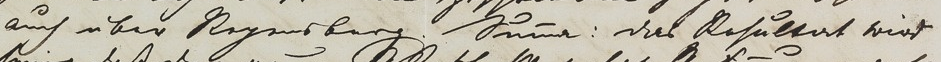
auch über Regensberg. Summa: das Resultat wird
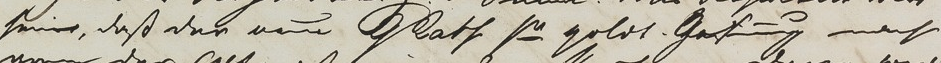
sein, daß der neue GRath sn polit. Gesinnung nach
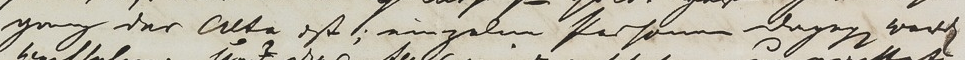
ganz der Alte ist; einzelne Personen dagegen werden
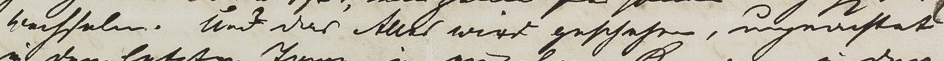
wechseln. Und das Alles wird geschehen, ungeachtet
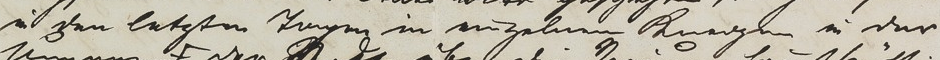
in den letzten Tagen in einzelnen Kneipen in der
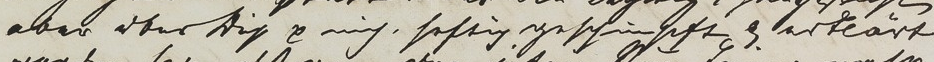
aber über Dich & mich, heftig geschimpft & erklärt
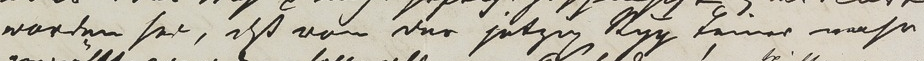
worden sei, dß von der jetzigen Rgg keiner mehr
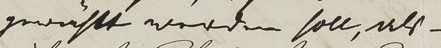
gewählt werden soll, als ­ ­
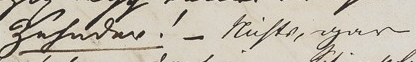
Zehnder! ­ Nichts, gar
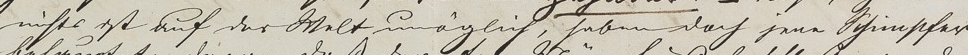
nichts ist auf der Welt unmöglich, haben doch jene Schimpfer
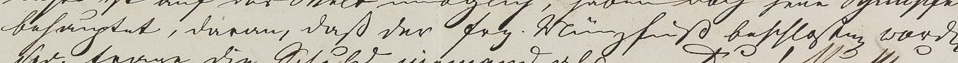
behauptet, daran, daß der frz. Münzfuß beschloßen worden
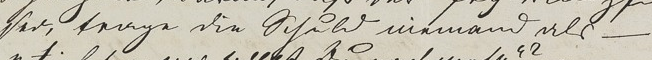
sei, trage die Schuld niemand als ­
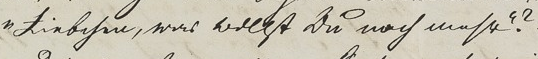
«Liebchen, was willst du noch mehr»? –
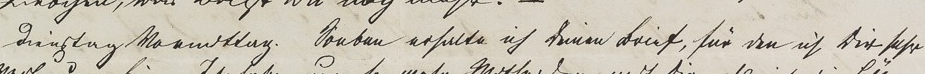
Dienstag Vormittag. Soeben erhalte ich Deinen Brief, für den ich Dir sehr
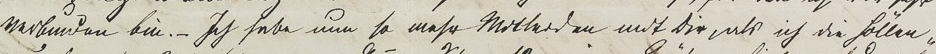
verbunden bin. ­ Ich habe um so mehr Mitleiden mit Dir als ich die Höllen-
